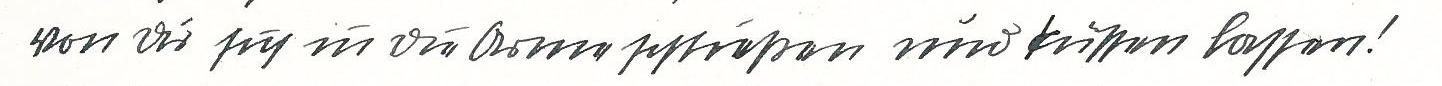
von Dir sich in die Arme schließen und küssen lassen!
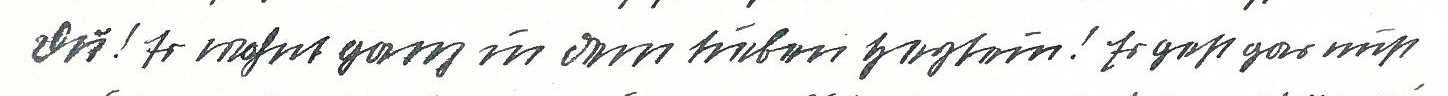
Du! Er wohnt ganz in dem lieben Herzlein! Er geht gar nicht
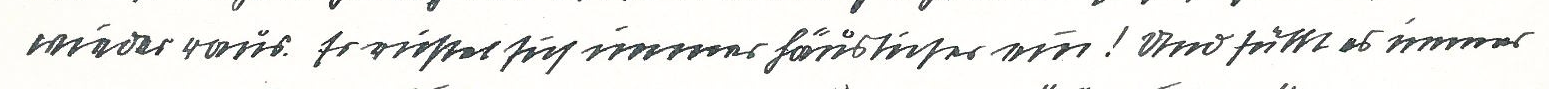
wieder raus. Er richtet sich immer häuslicher ein! Und füllt es immer
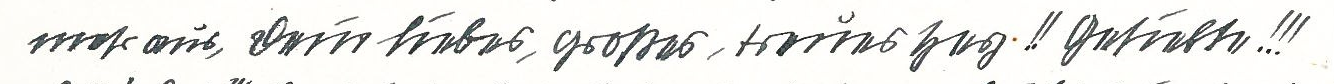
mehr aus, Dein liebes, großes, treues Herz!! Geliebte!!!
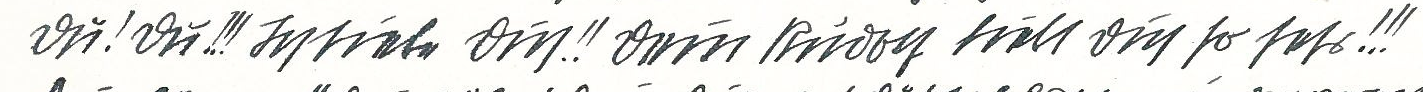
Du! Du!!! Ich liebe Dich!! Dein liebt Dich so sehr!!!
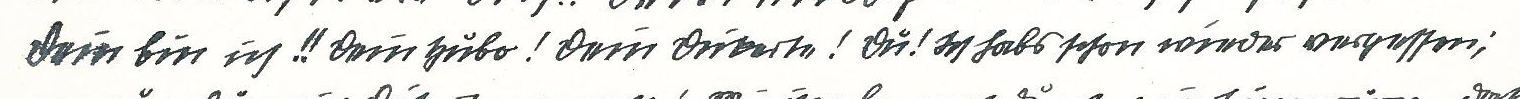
Dein bin ich!! Dein Hubo! Dein Dickerle! Du! Ich habe schon wieder vergessen;
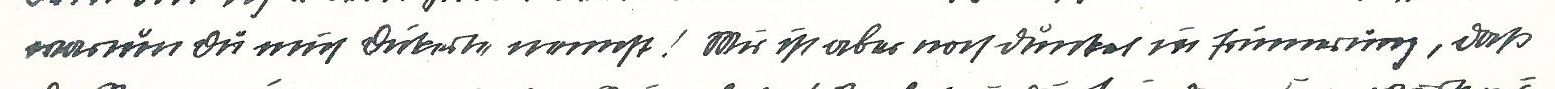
warum Du mich Dickerle nennst! Mir ist aber noch dunkel in Erinnerung, daß
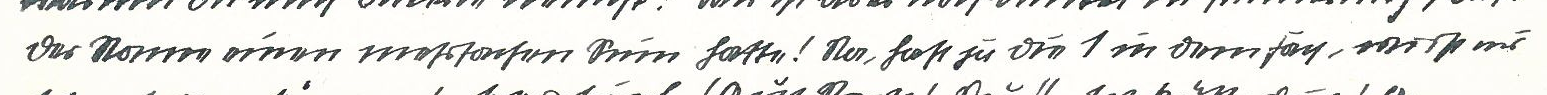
der Name einen mehrfachen Sinn hatte! Na, hast ja die 1 in dem Fach, wirst mir
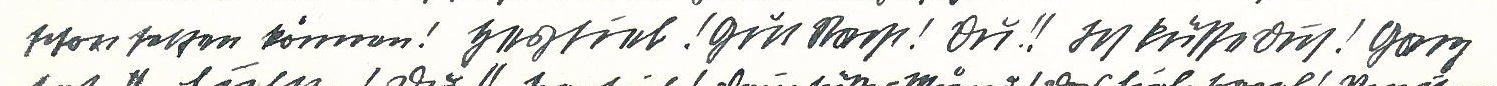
schon helfen können. Herzlieb! Gut Nacht! Du!! Ich küsse Dich! Ganz
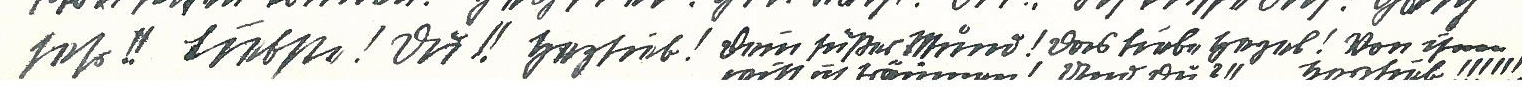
sehr!! Liebste! Du!! Herzlieb! Dein süßer Mund! Das liebe Herzel! Von ihnen
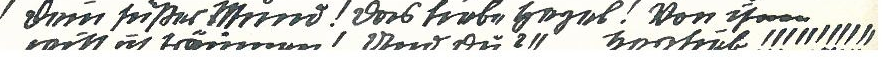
will ich träumen! Und Du?!! Herzlieb!!!!!!!!!!!
